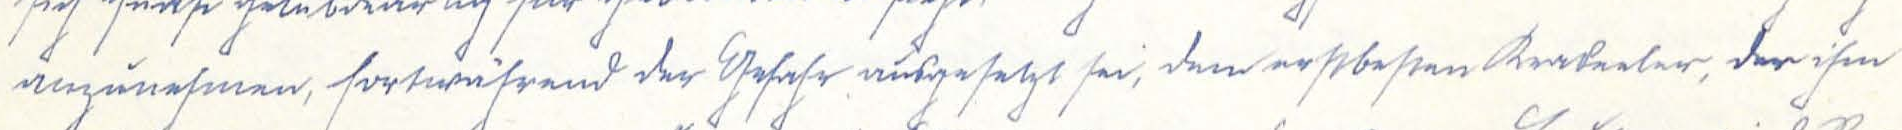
anzunehmen, fortwährend der Gefahr ausgesetzt sei, dem erstbesten Krakeeler der ihm
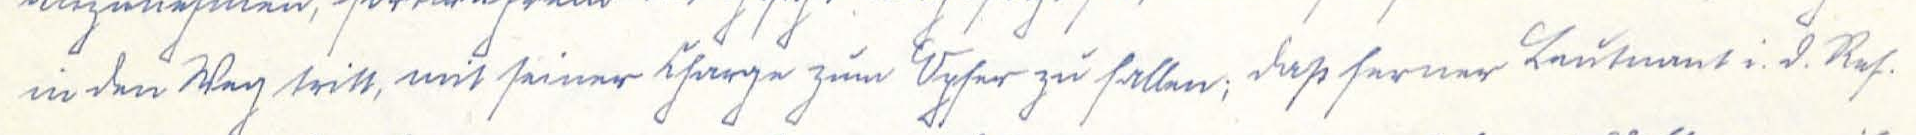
in den Weg tritt, mit seiner Charge zum Opfer zu fallen; daß ferner Leutnant i. d. Res.
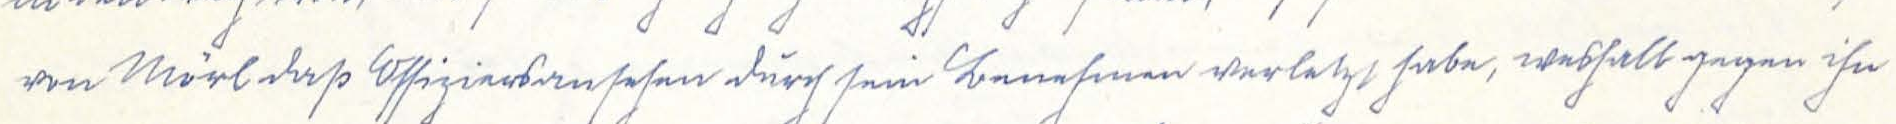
von Mörl daß Offiziersansehen durch sein Benehmen verletzt habe, weshalb gegen ihn
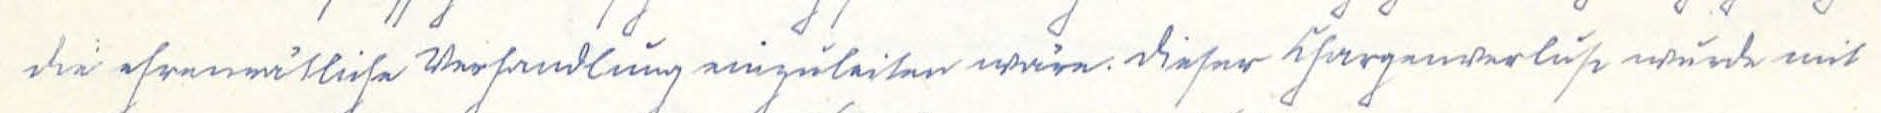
die ehrenrätliche Verhandlung einzuleiten wäre. Dieser Chargenverlust wurde mit
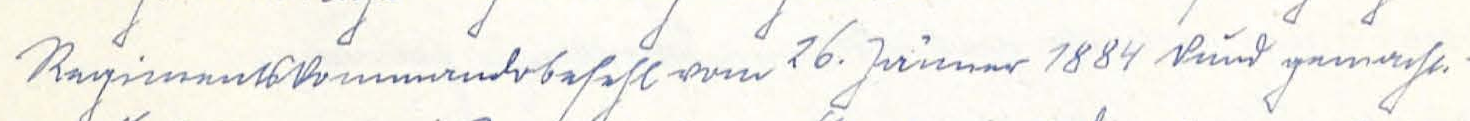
Regimentskommandobefehl vom 26. Jänner 1884 kund gemacht.-
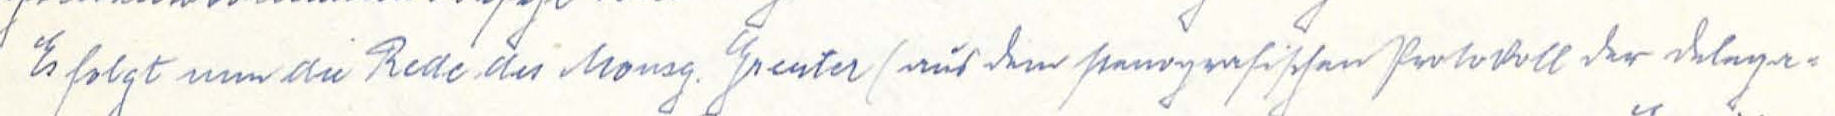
Es folgt nun die Rede des Monsg. Greuter (aus dem stenografischen Protojoll de Delega-
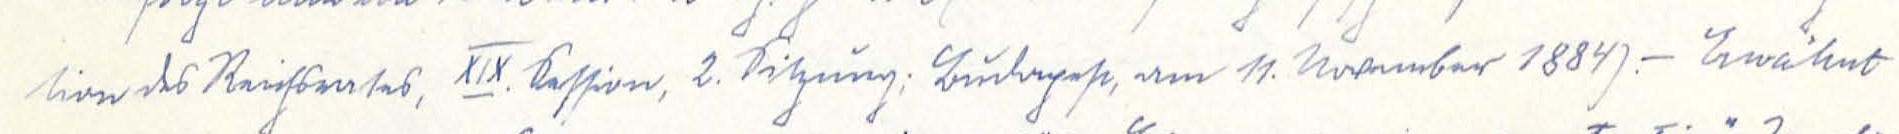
tion des Reichsrates, XIX. Session, 2. Sitzung; Budapest, am 11. November 1884).- Erwähnt
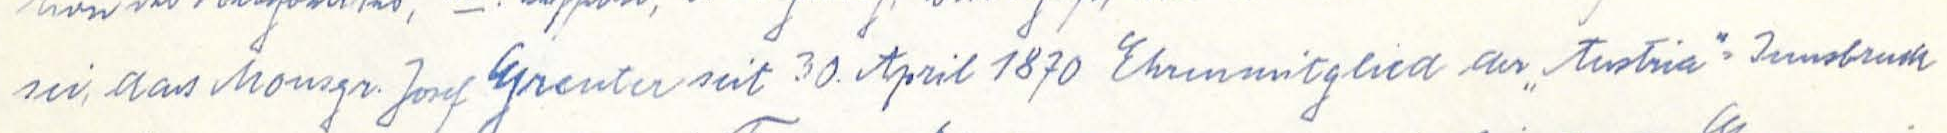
sei, das Monsgr. Josef Greuter seit 30. April 1870 Ehrenmitglied der "Austria" Innsbruck
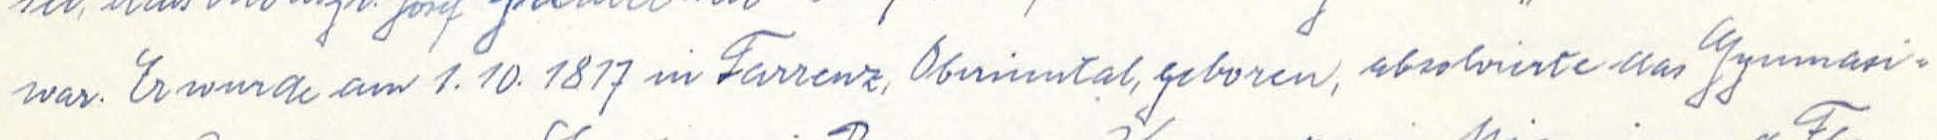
war. Er wurde am 1.10.1817 in Farrenz, Oberinntal, geboren, absolvierte das Gymnasi-
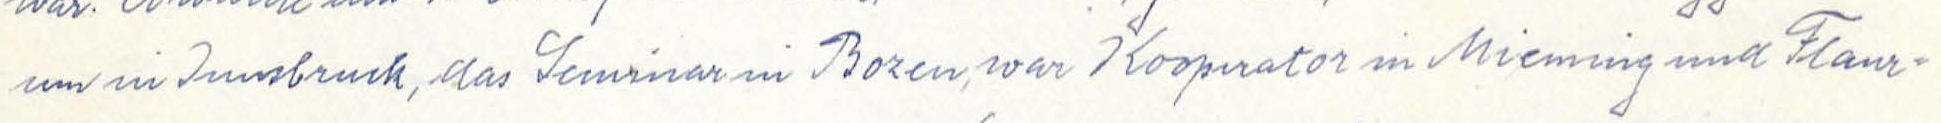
um in Innsbruck, das Seminar in Bozen, war Kooperator in Mieming und Flaur-
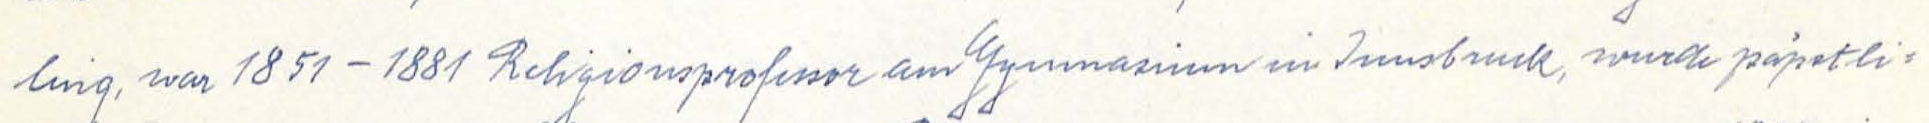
ling, war 1851-1881 Religionsprofessor am Gymnasium in Innsbruck, wurde päpstli-
